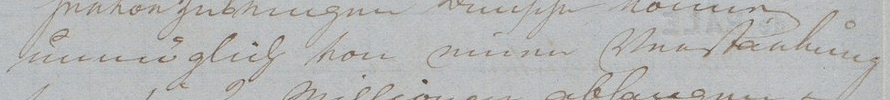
unmöglich von einer Verstärkung
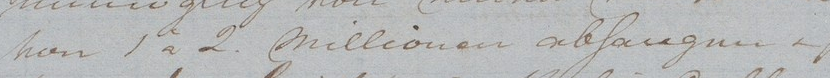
von 1 à 2. Millionen abhangen &
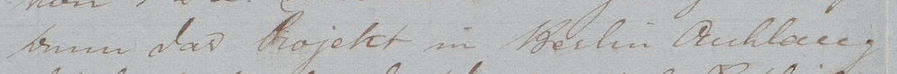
wenn das Projekt in Berlin Anklang
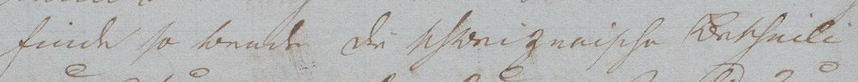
finde so werde die schweizerische Betheili-
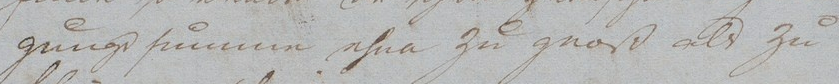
gungssumme eher zu groß als zu
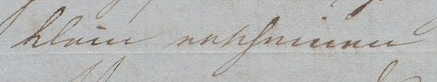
klein erscheinen. –
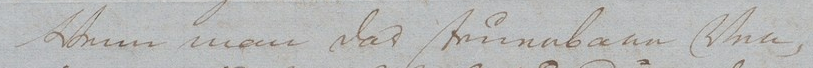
Wenn man das steuerbare Ver-
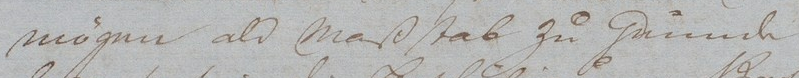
mögen als Maßstab zu Grunde
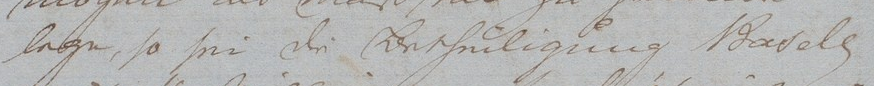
lege, so sei die Betheiligung Basels
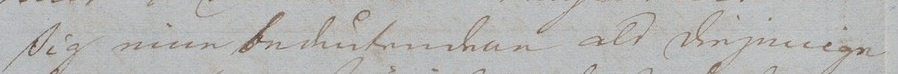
ßig eine bedeutendere als diejenige
